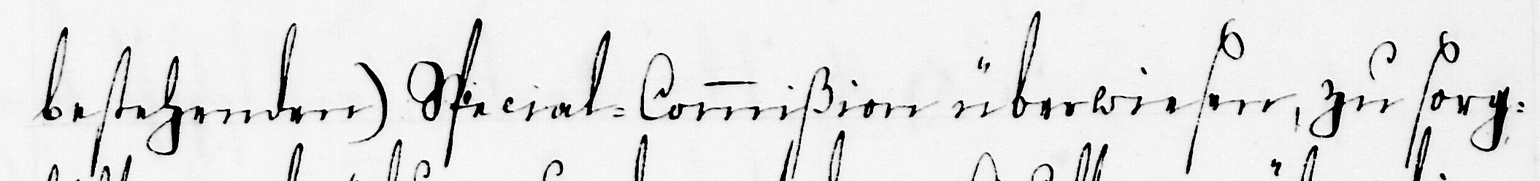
bestehenden) Special-Commißion überwiesen, zu sorg¬
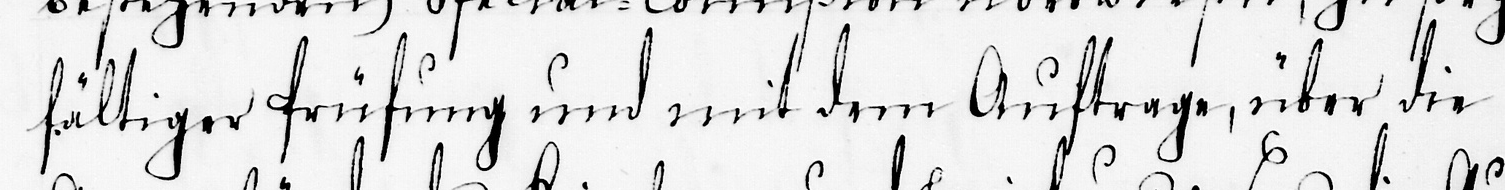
fältiger Prüfung und mit dem Auftrage, über die
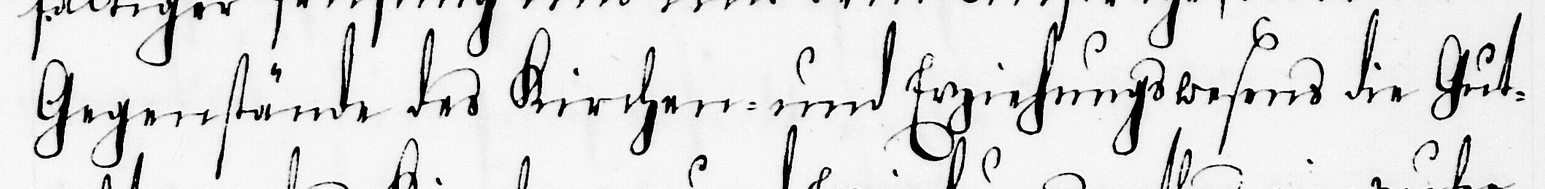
Gegenstände des Kirchen- und Erziehungswesens die Gut¬
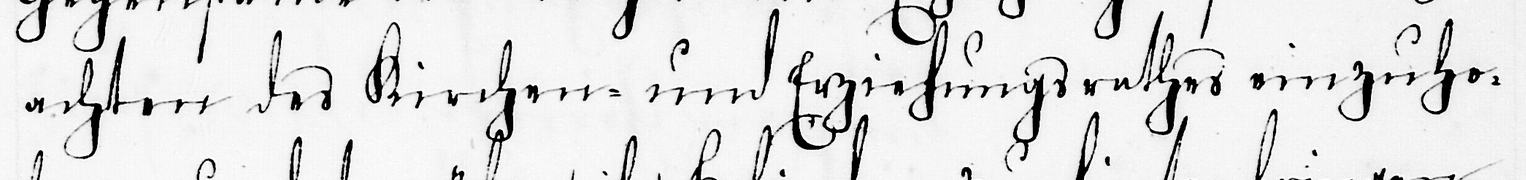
achten des Kirchen- und Erziehungsrathes einzuho¬
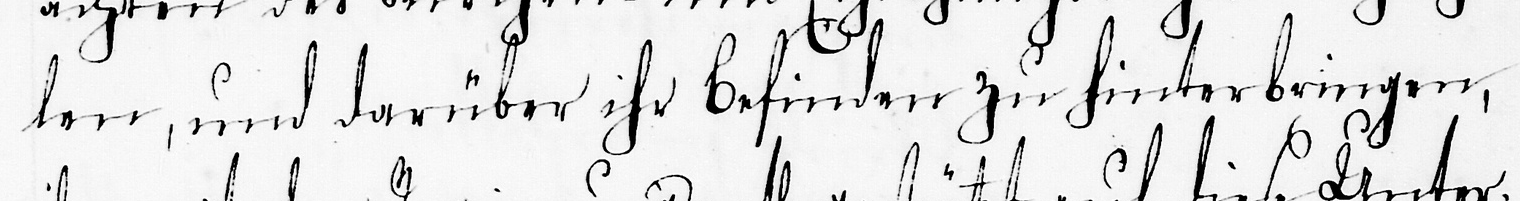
len, und darüber ihr Befinden zu hinterbringen,
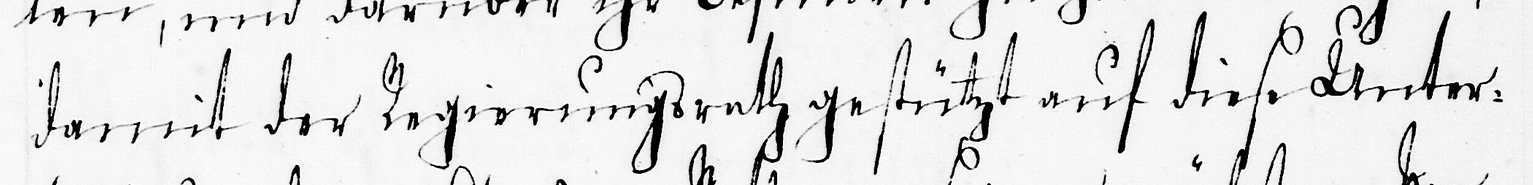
damit der Regierungsrath gestützt auf diese Unter¬
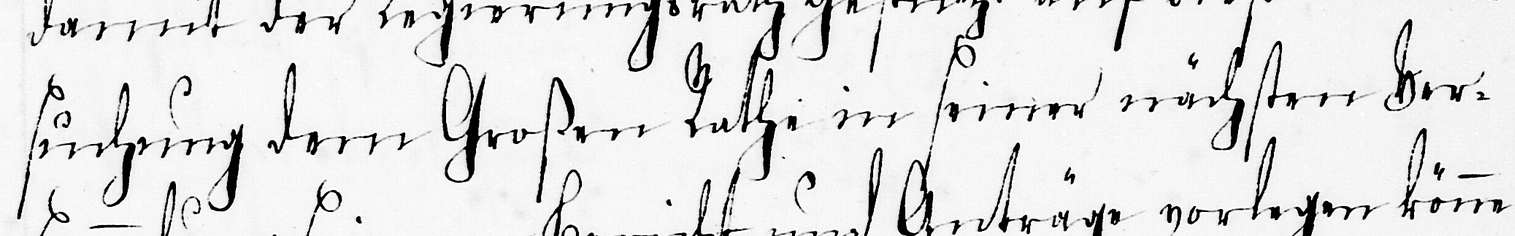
suchung dem Großen Rathe in seiner nächsten Ver¬
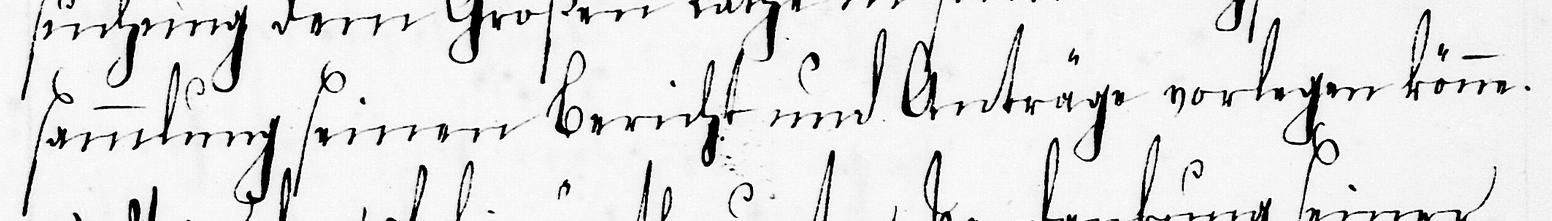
sammlung seinen Bericht und Anträge vorlegen könne.
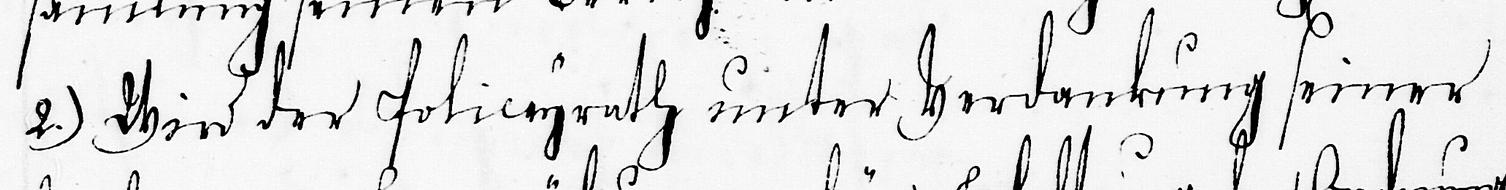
2.) Wird der Policeyrath unter Verdankung seiner
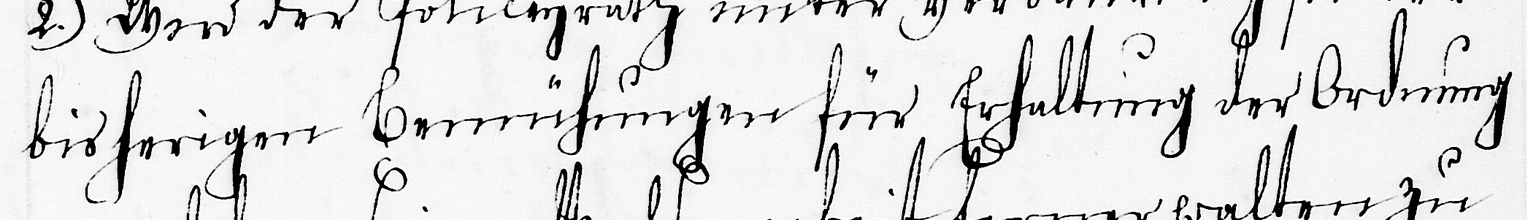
bisherigen Bemühungen für Erhaltung der Ordnung
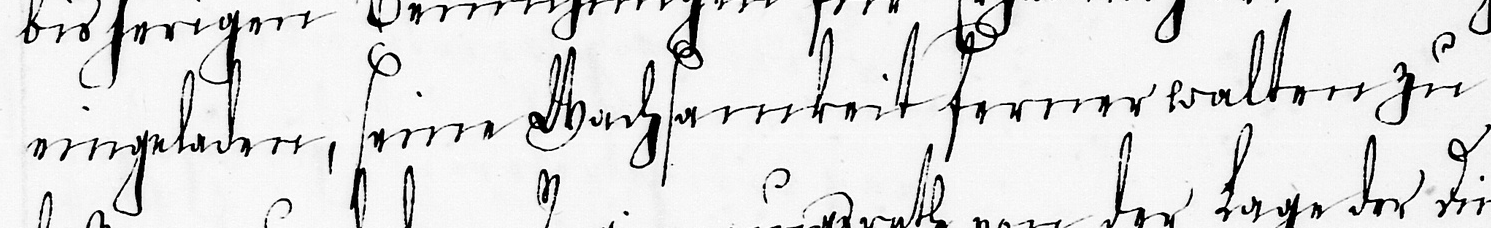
eingeladen, seine Wachsamkeit ferner walten zu
